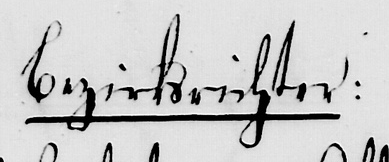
Bezirksrichter:
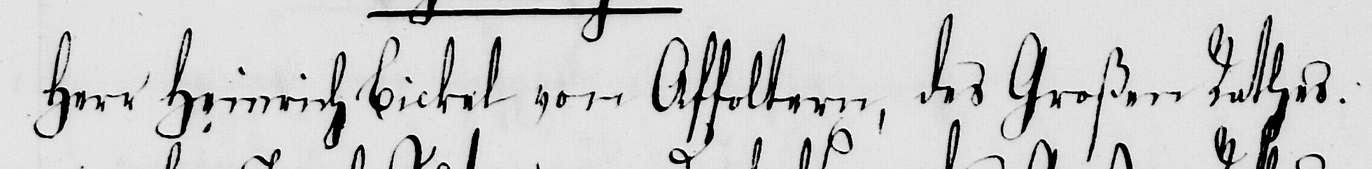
Herr Heinrich Bickel von Affoltern, des Großen Rathes.
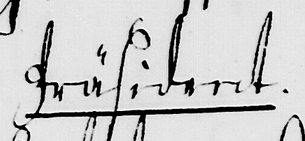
Präsident.
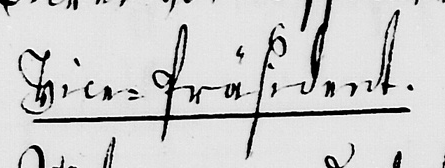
Vice-Präsident.
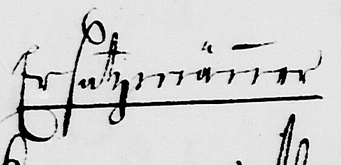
Ersatzmänner
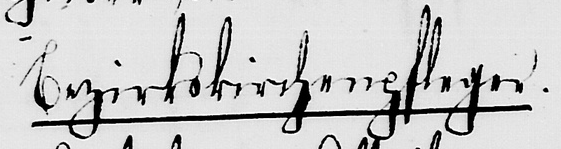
Bezirkskirchenpfleger.
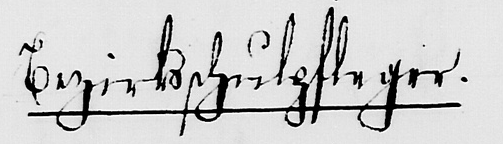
Bezirksschulpfleger.
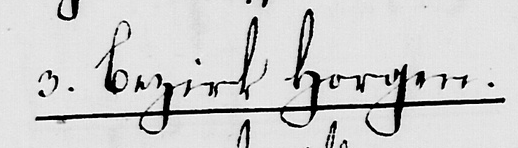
3. Bezirk Horgen
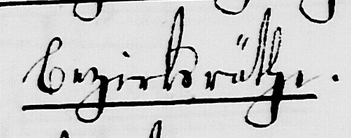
Bezirksräthe.
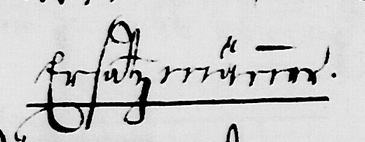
Ersatzmänner.
